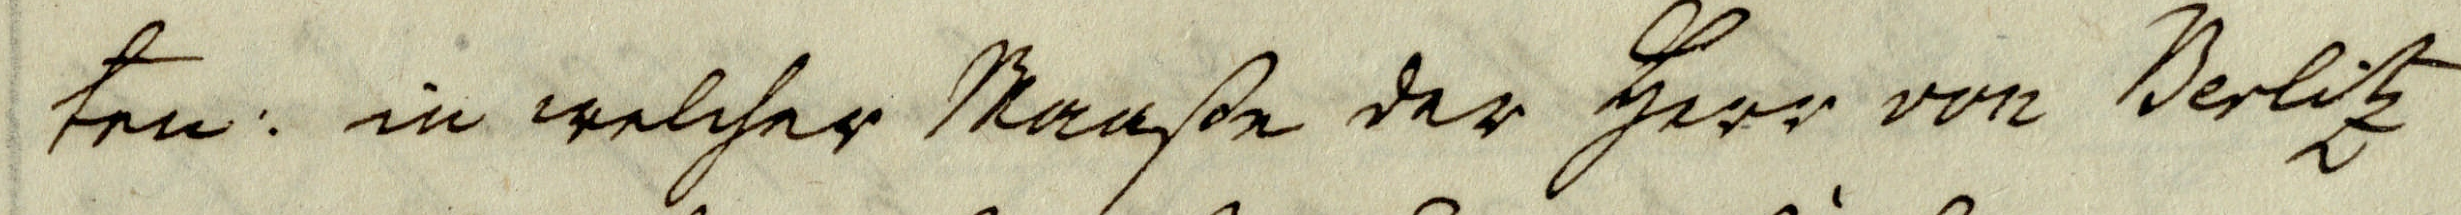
ten: in welcher Maaße der Herr von Berlitz
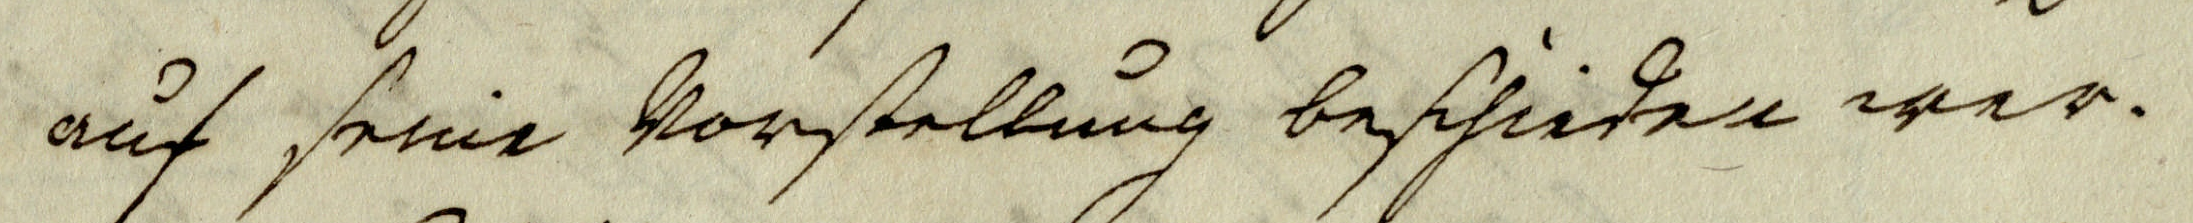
auf seine Vorstellung beschieden wer¬
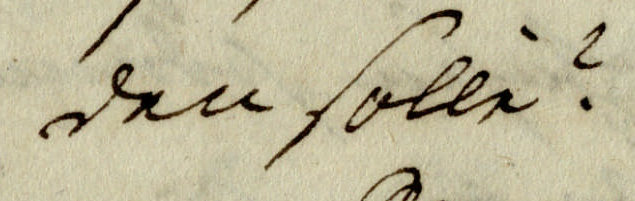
den solle?
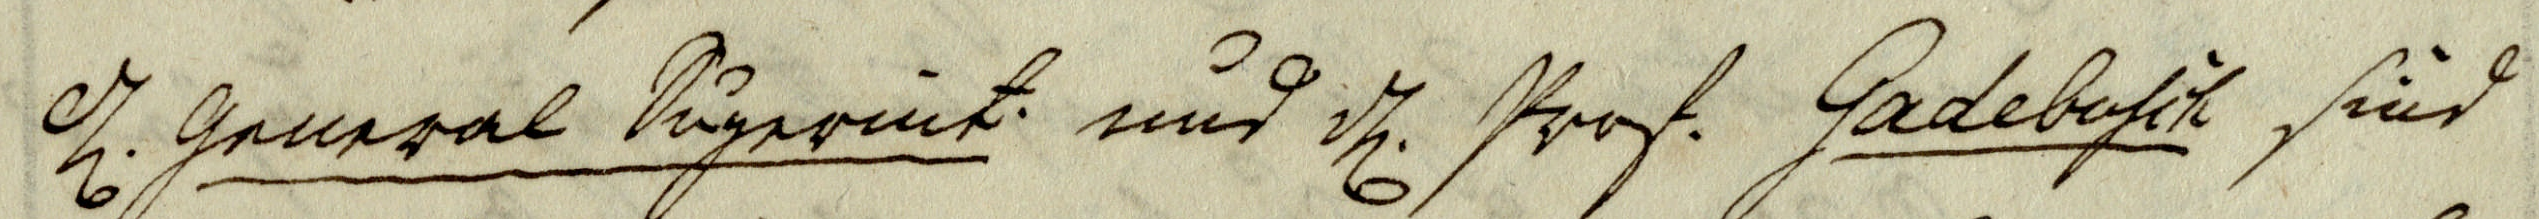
dh. General Superint. und dh. Prof. Gadebusch sind
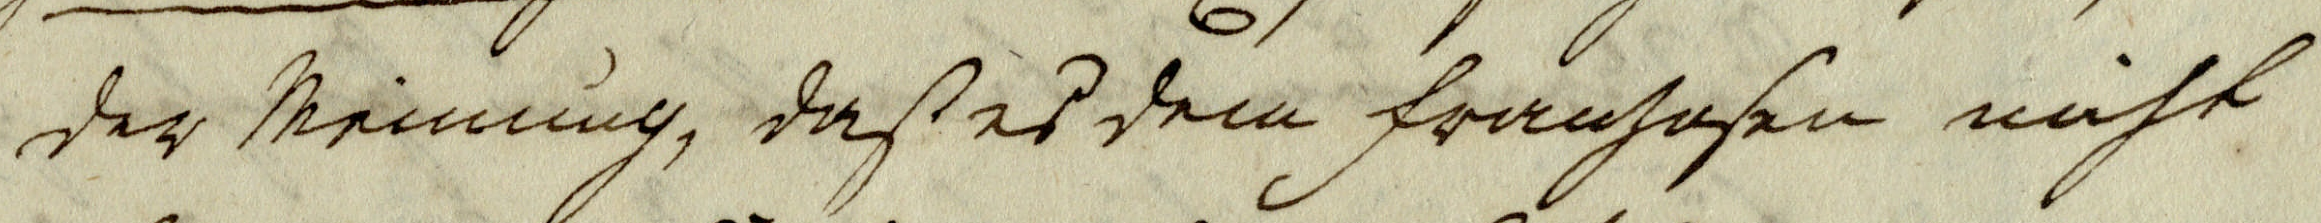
der Meinung, daß es dem Franzosen nicht
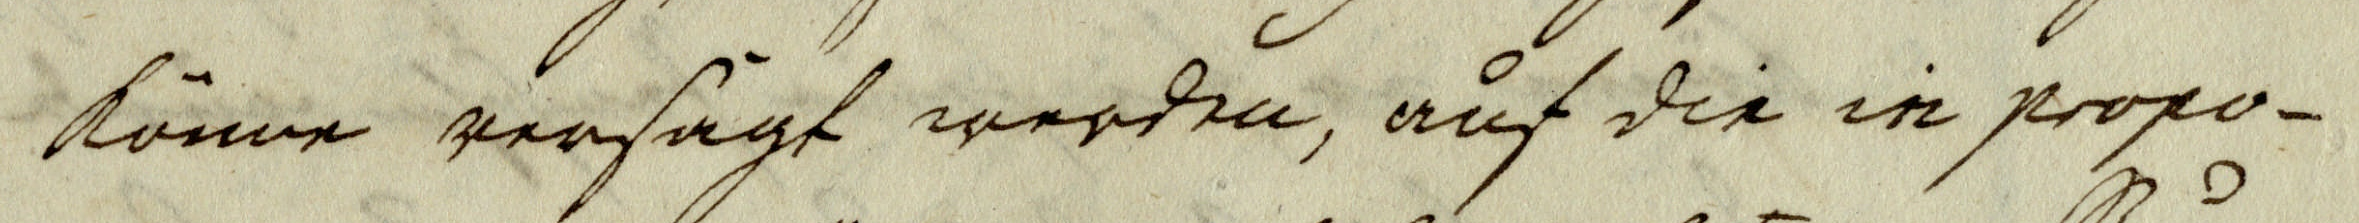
könne versagt werden, auf die in propo¬
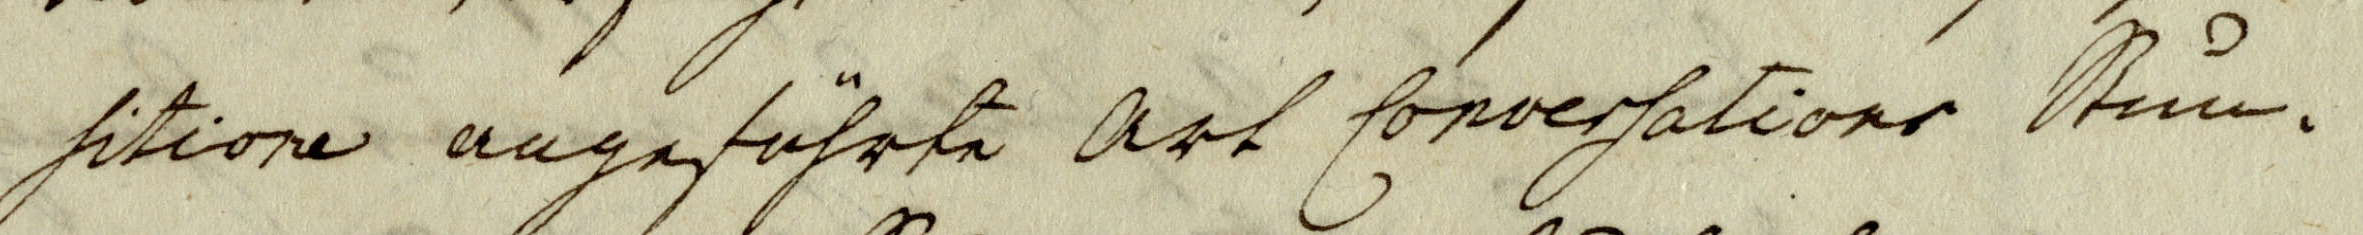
sitione angeführte Art Conversations Stund¬
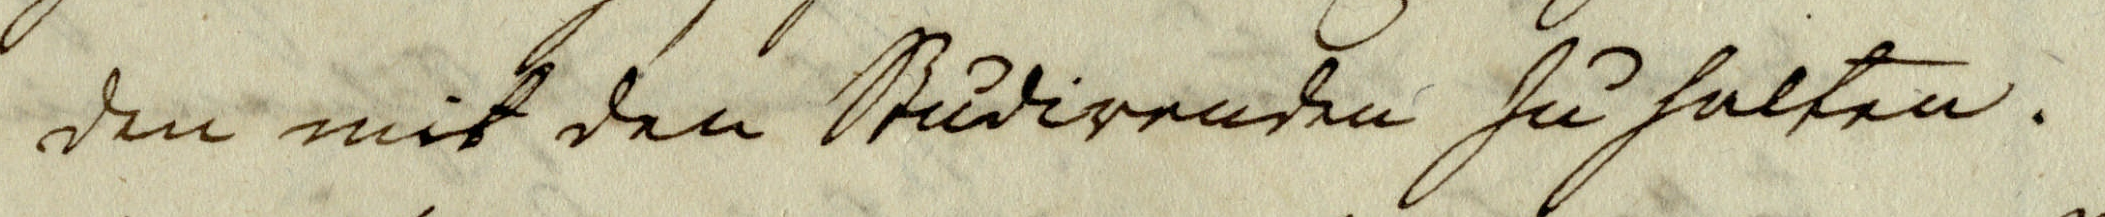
den mit den Studirenden zu halten.
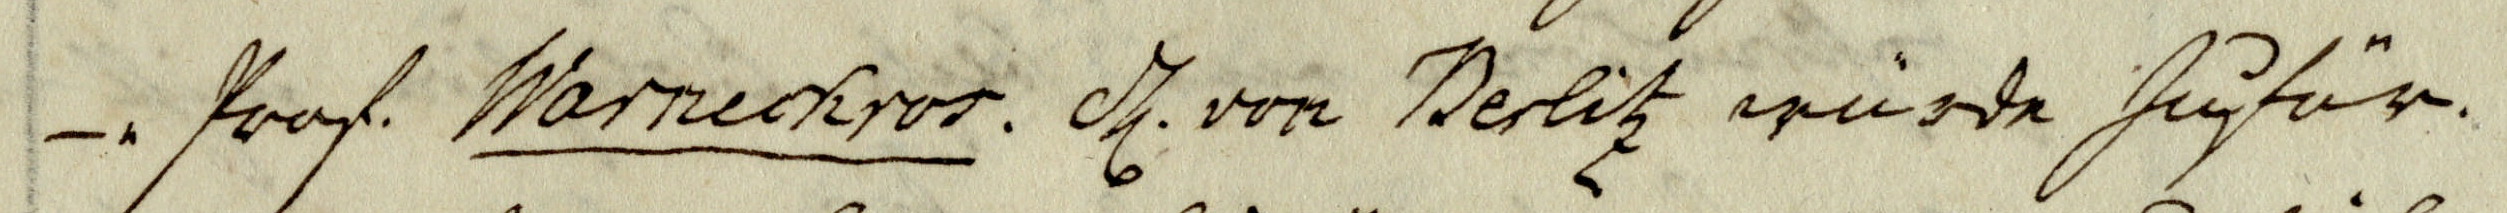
— " Prof. Warneckros. dh. von Berlitz würde zuför¬
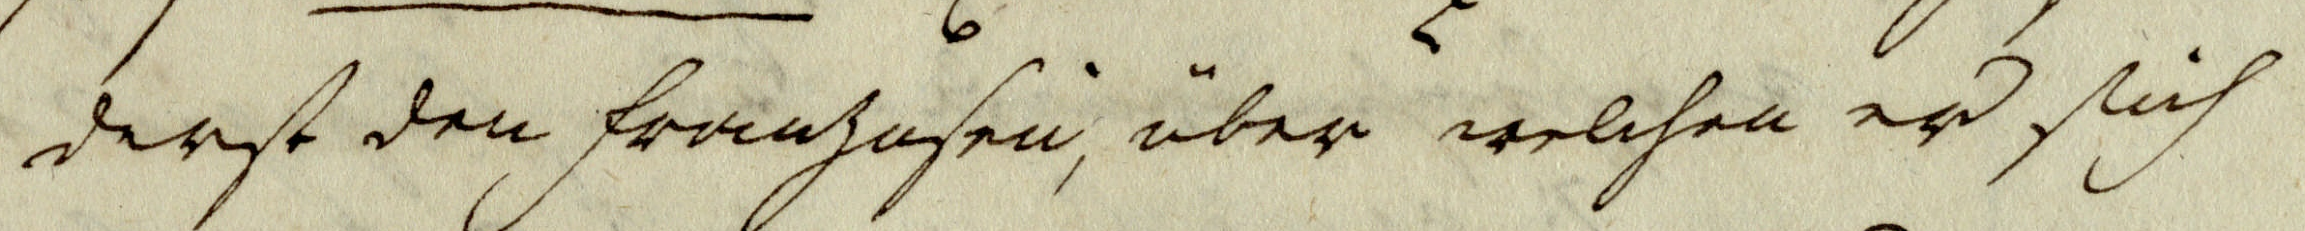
derst den Franzosen, über welchen er sich
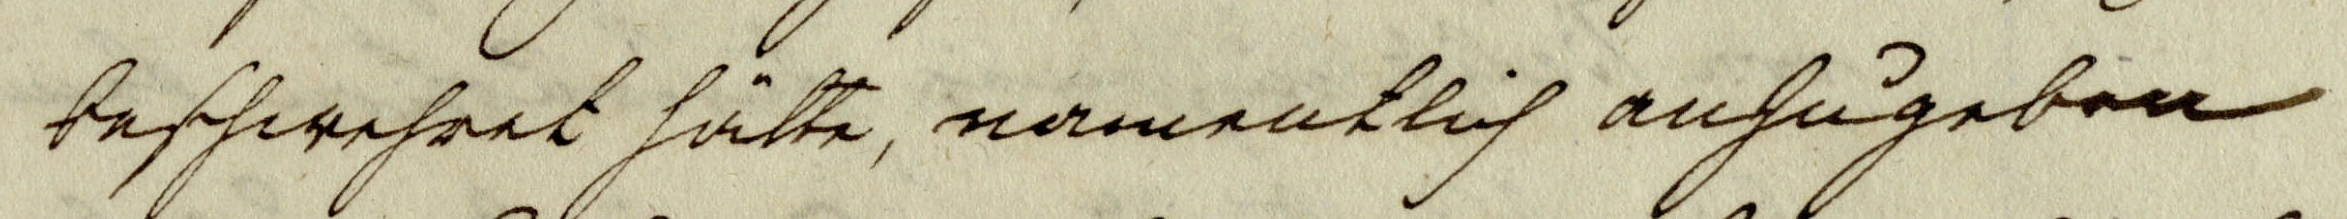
beschwehret hätte, namentlich anzugeben
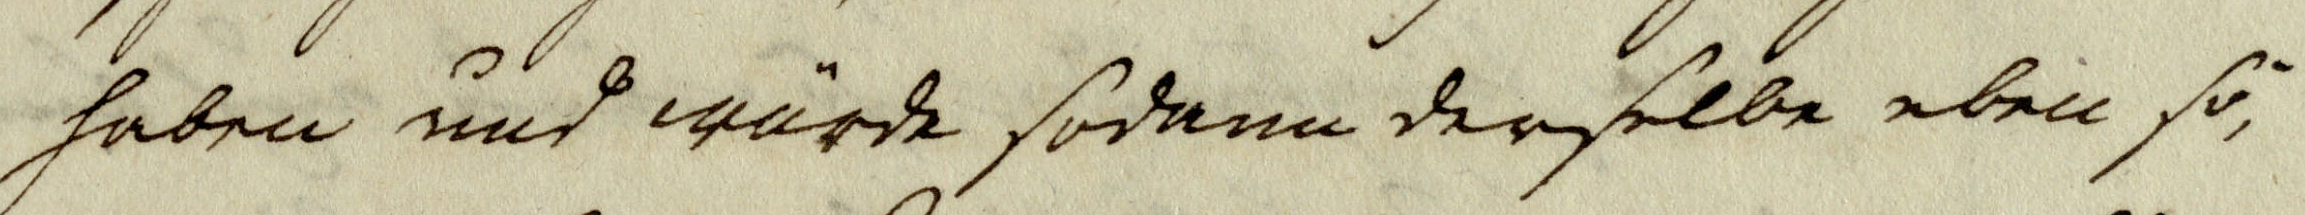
haben und würden sodann derselbe eben so,
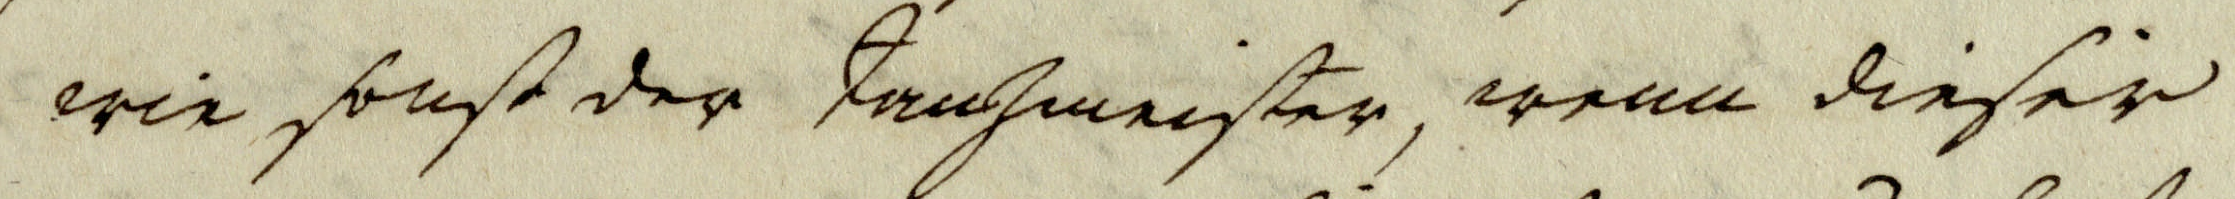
wie sonst der Tanzmeister, wenn dieser
